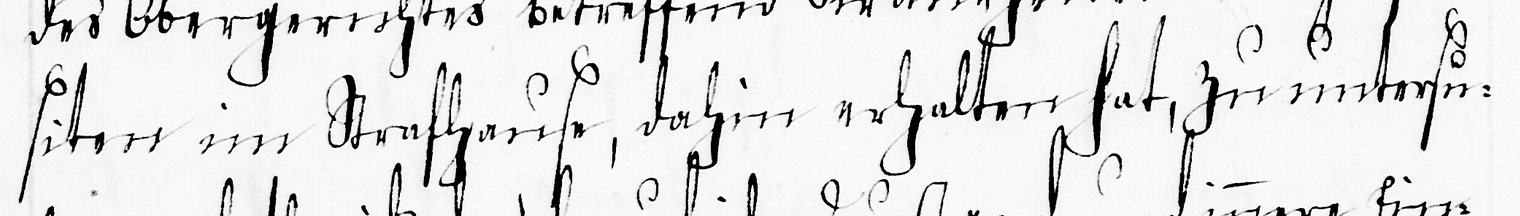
siten im Strafhause, dahin erhalten hat, zu untersu¬
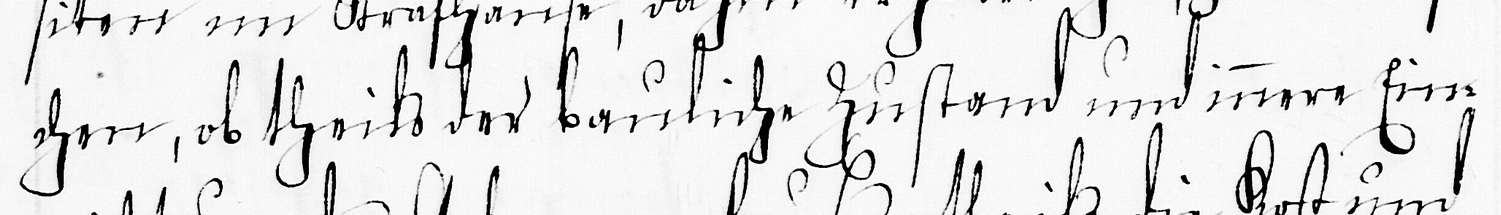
chen, ob theils der bauliche Zustand und innere Ein¬
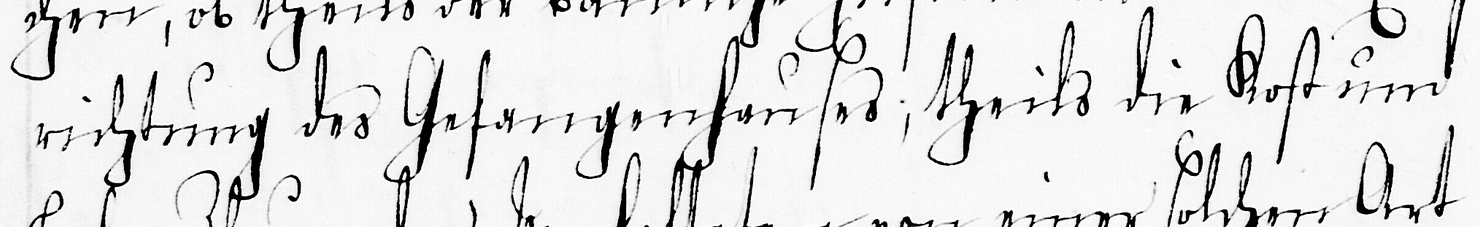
richtung des Gefangenhauses, theils die Kost und
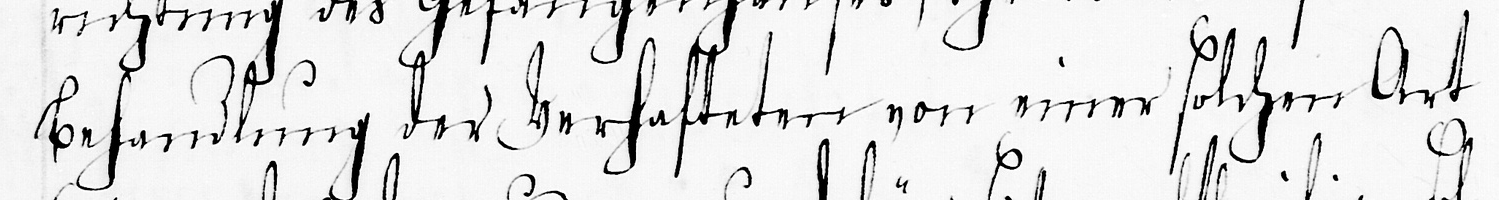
Behandlung der Verhafteten von einer solchen Art
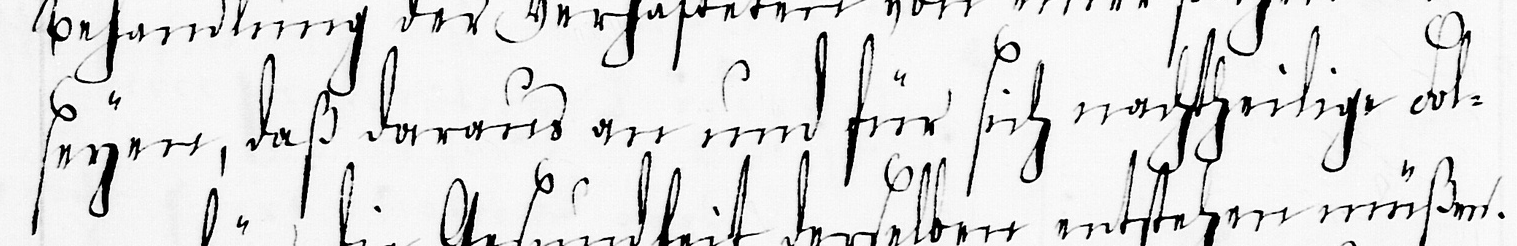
seyen, daß daraus an und für sich nachtheilige Fol¬
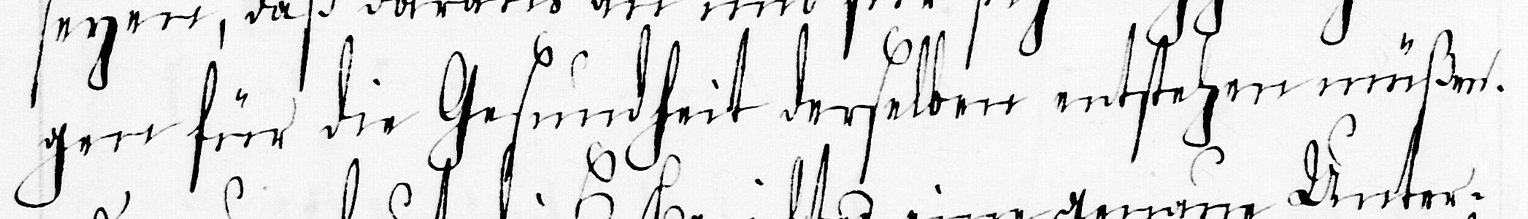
gen für die Gesundheit derselben entstehen müßen.
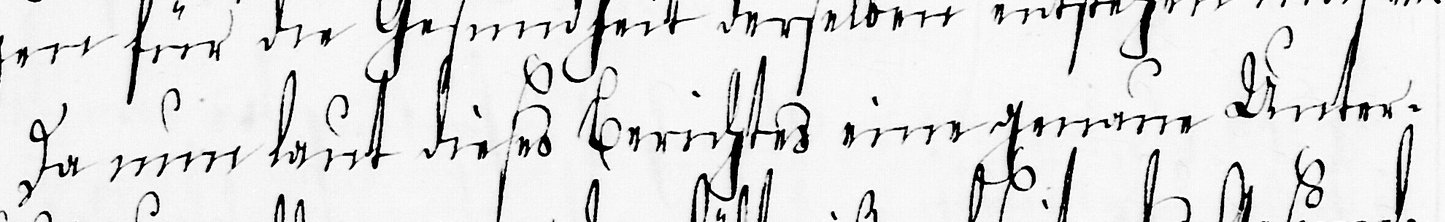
Da nun laut dieses Berichtes eine genaue Unter¬
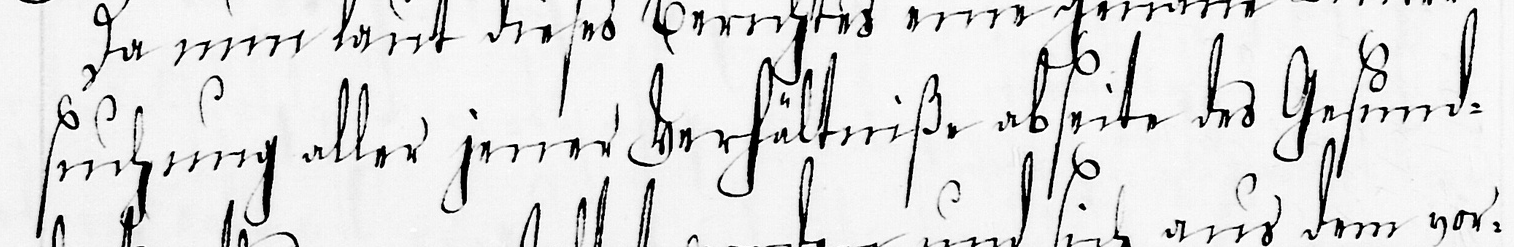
suchung aller jener Verhältniße abseite des Gesund¬
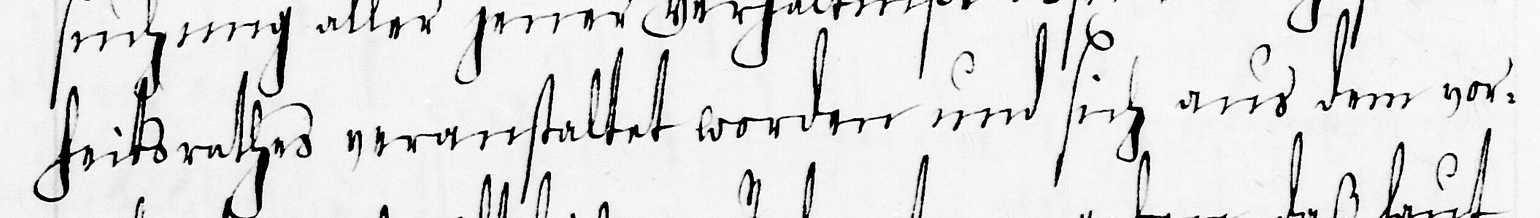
heitsrathes veranstaltet worden und sich aus dem vor¬
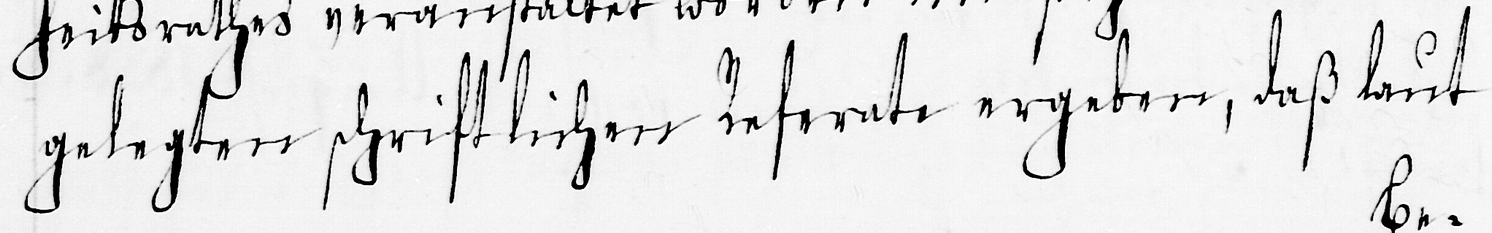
gelegten schriftlichen Referate ergeben, daß laut
